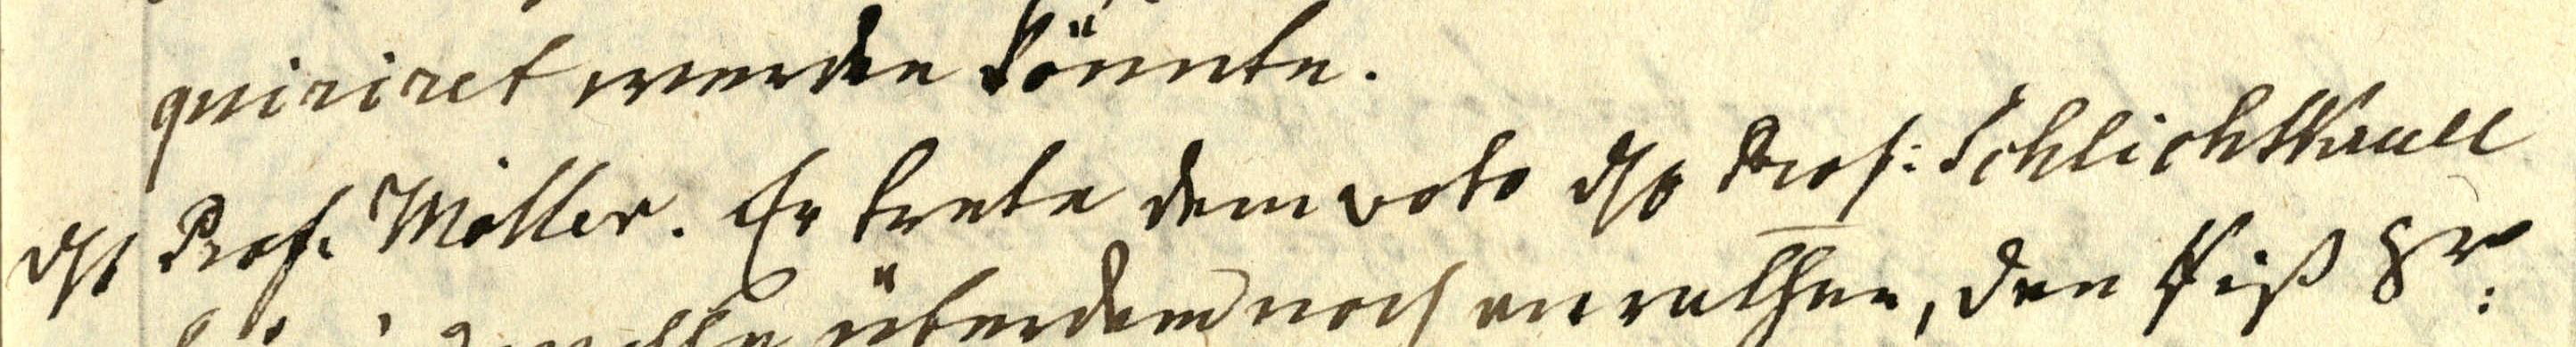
dh Prof. Möller. Er trete dem voto dh Prof. Schlichtkrull
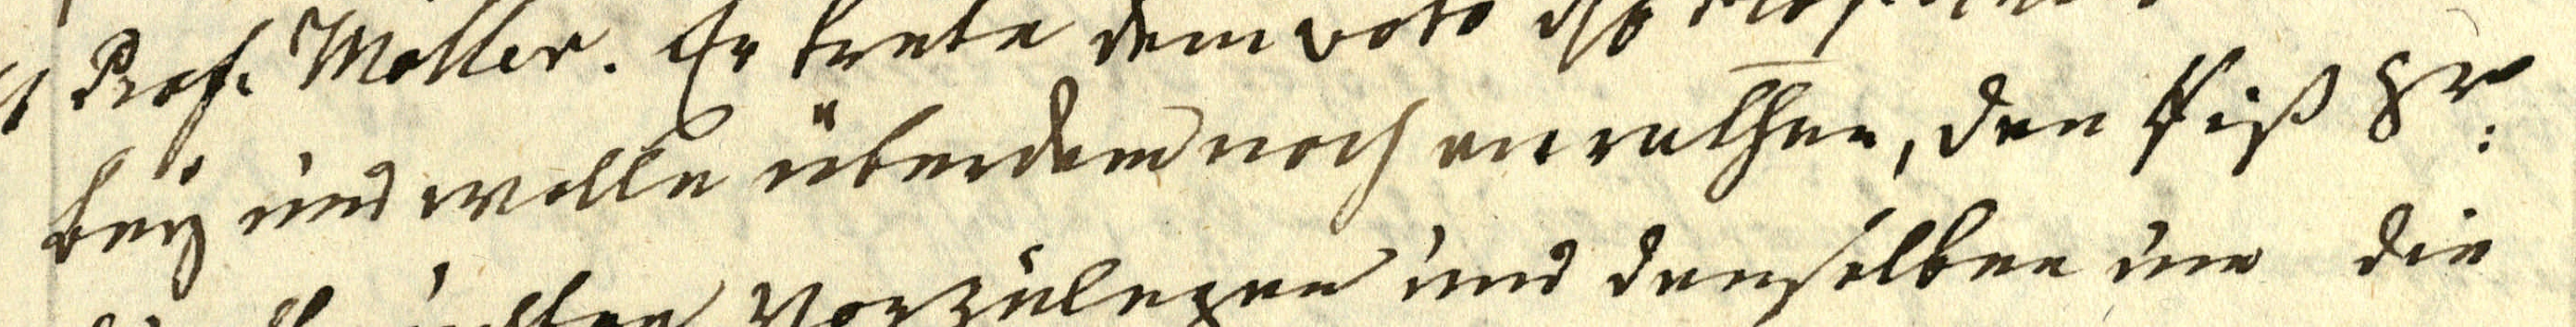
beÿ und wolle überdem noch anrathen, den Riß Sr
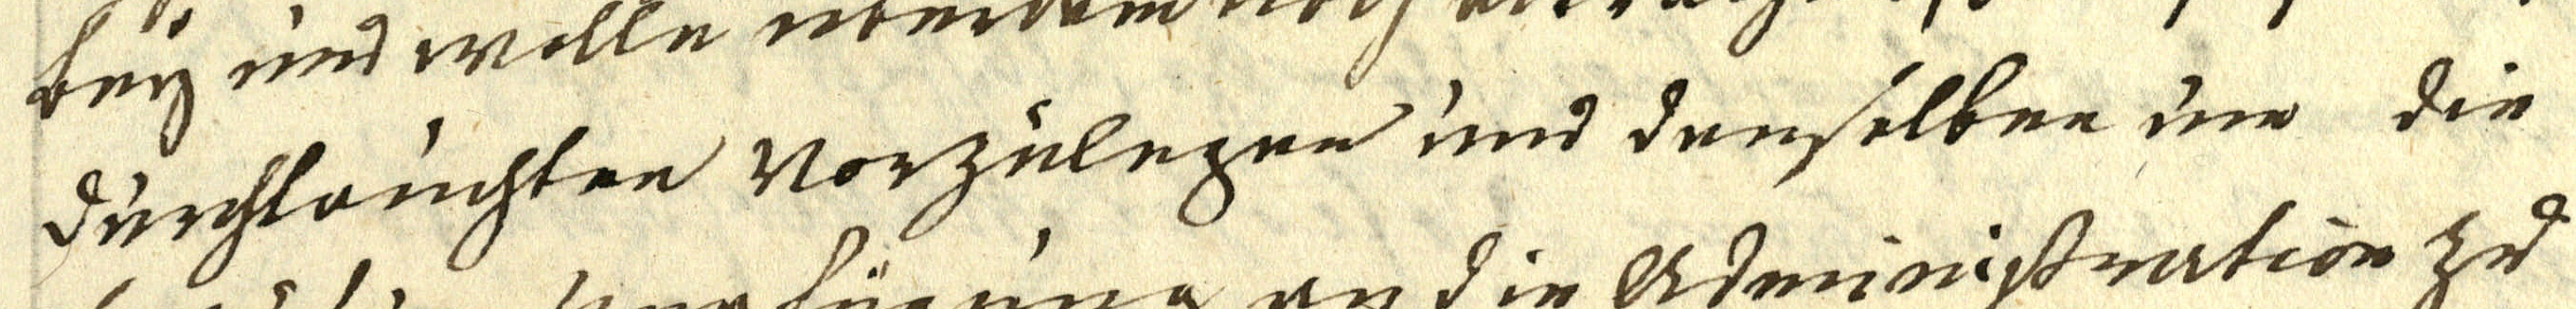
Durchlauchten vorzulegen und denselben um die
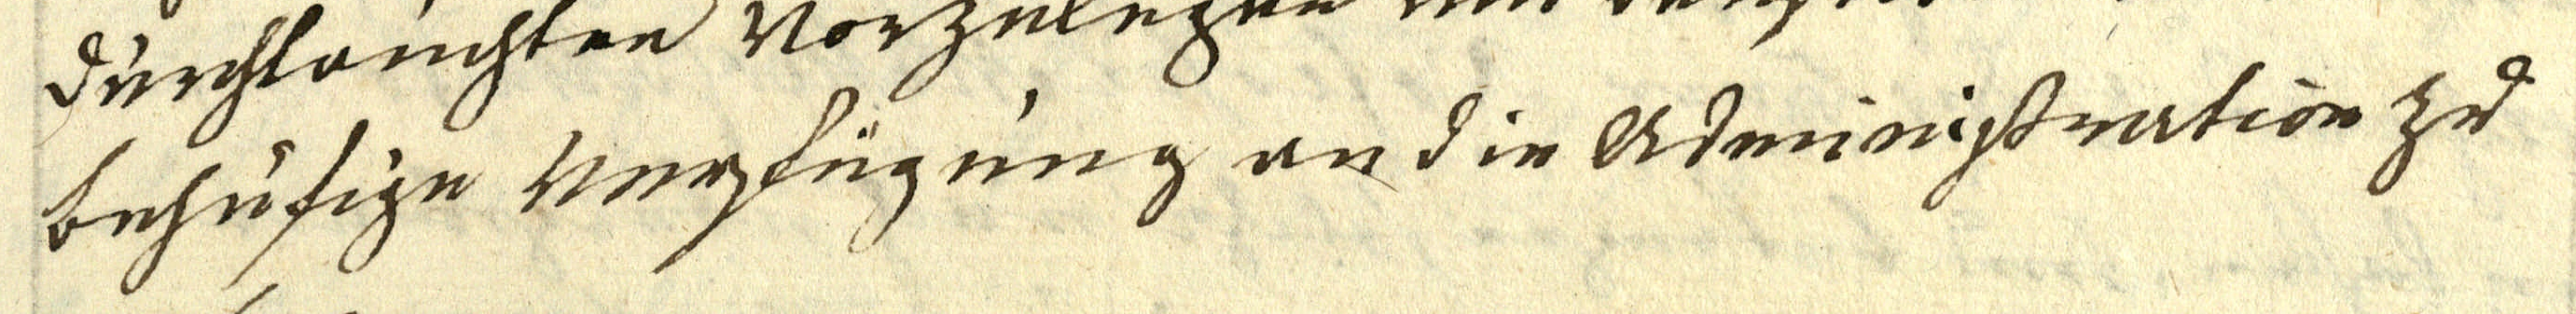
behufige Verfügung an die Administration zu
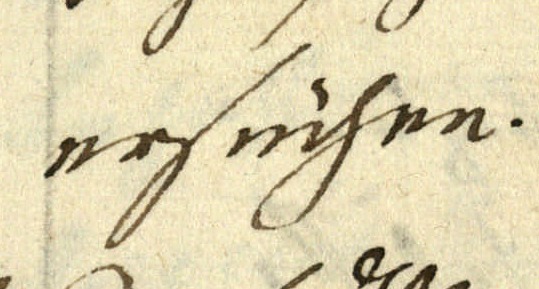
ersuchen.
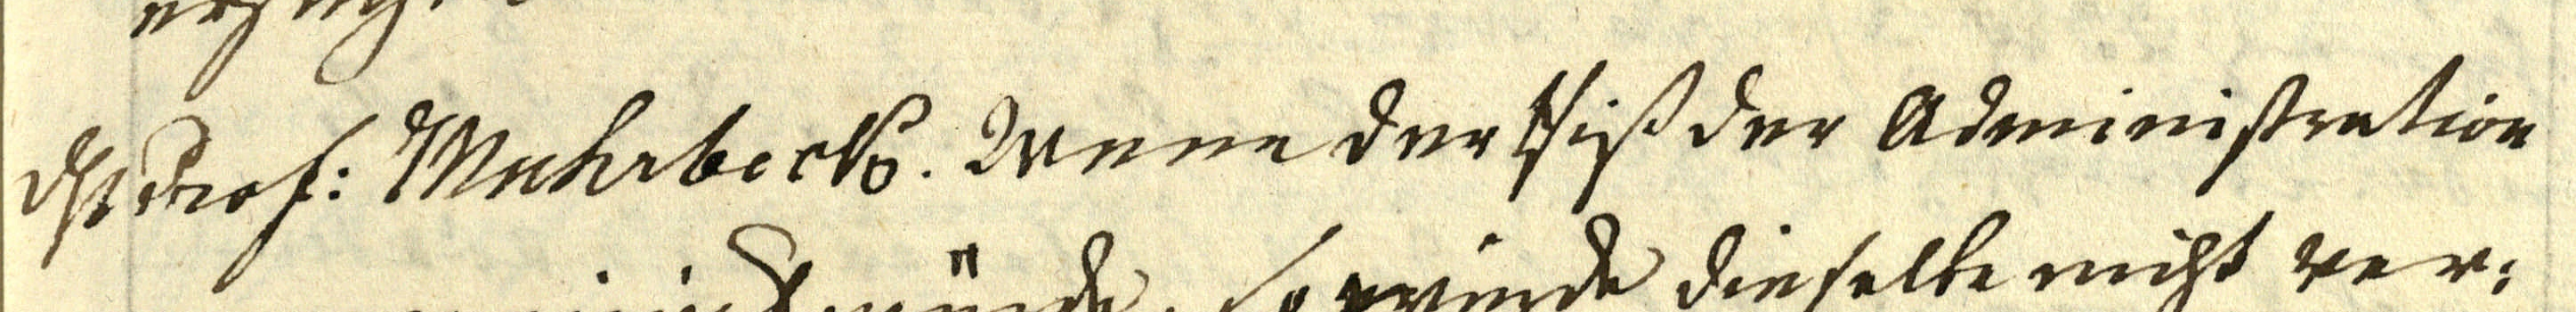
dh Prof. Muhrbeck. Wenn der Riß der Administration
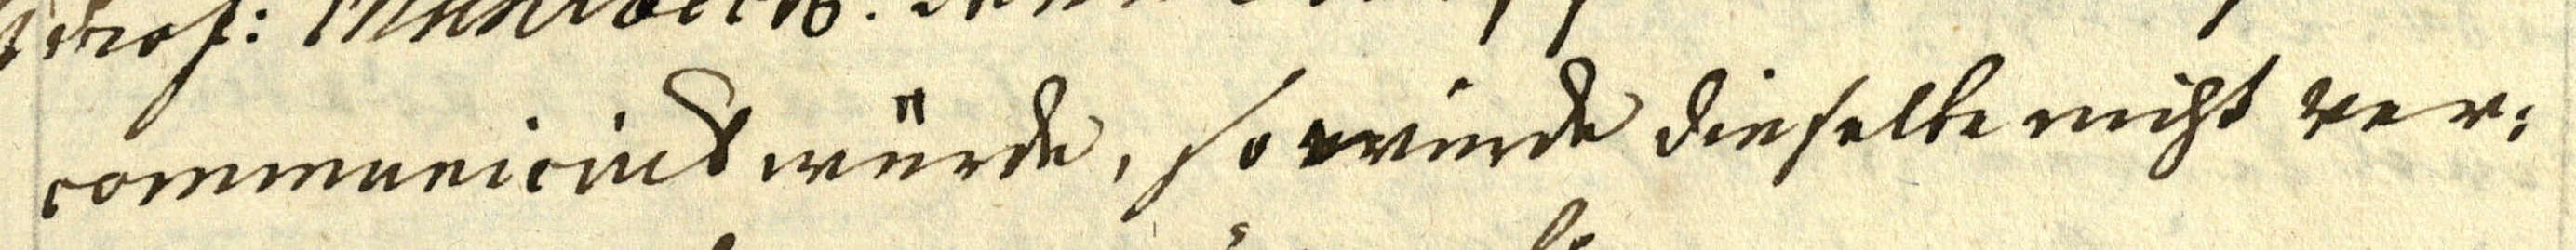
communiciret würde, so würde dieselbe nicht ver¬
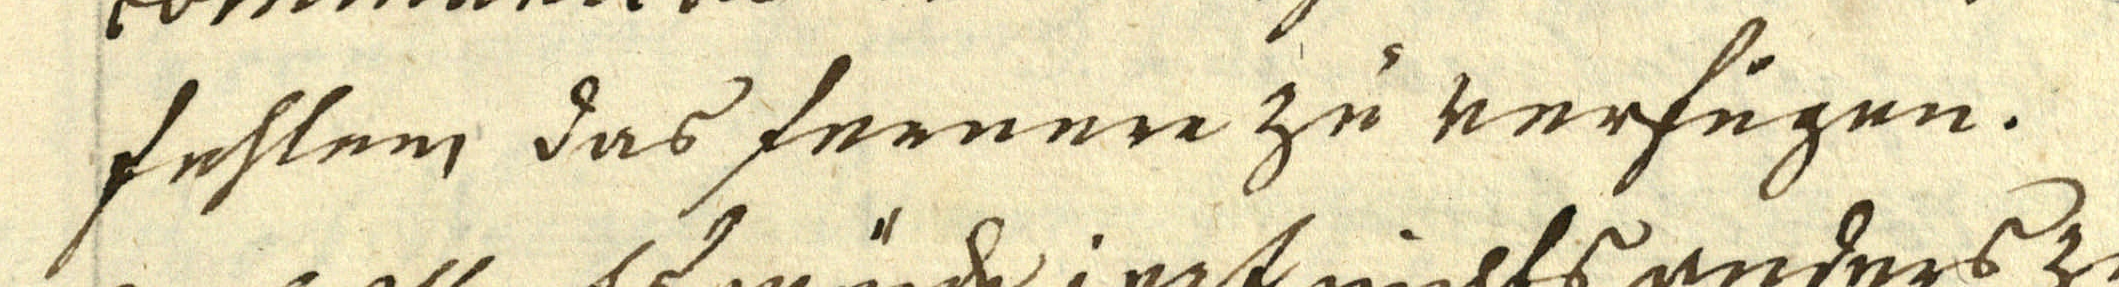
fehlen, das fernere zu verfügen.
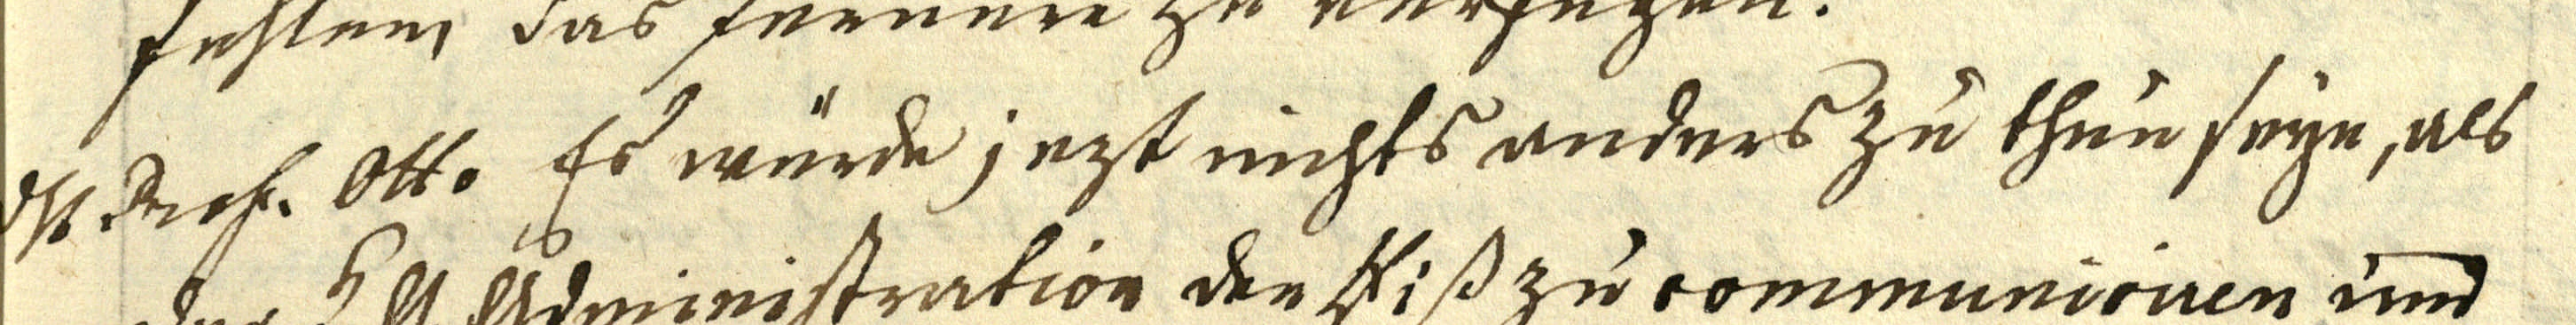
dh Prof. Otto Es würde jezt nichts anders zu thun seÿn, als
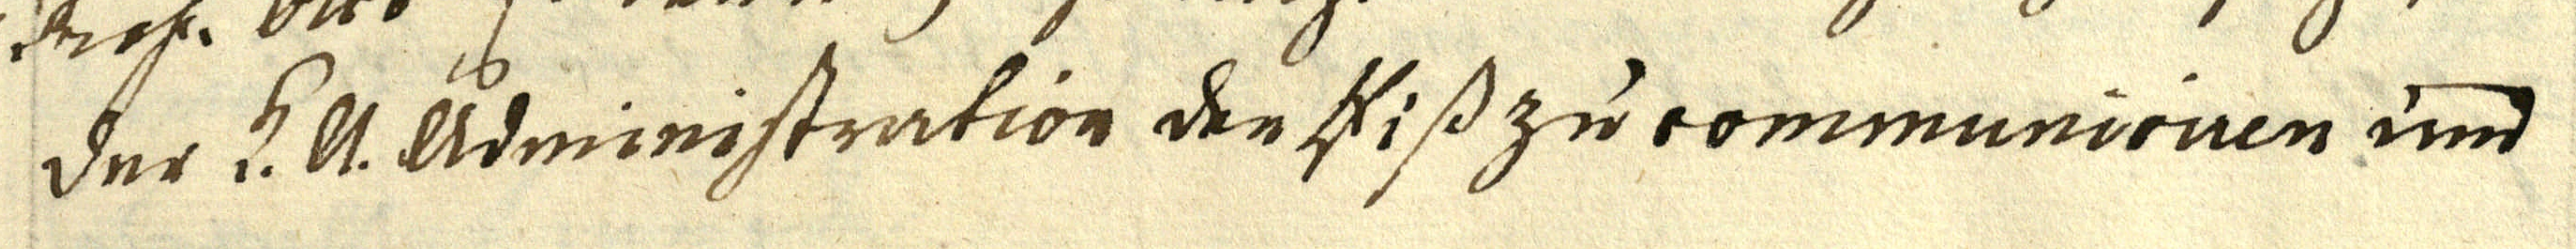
der K. A. Administration den Riß zu communiciren und
